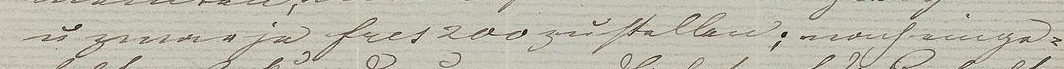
u zwar je frcs 200 zustellen; nach einge-
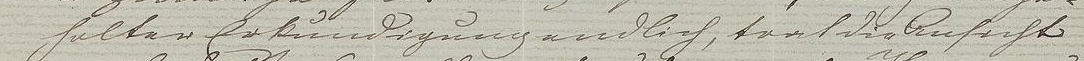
holter Erkundigung endlich, trat die Ansicht
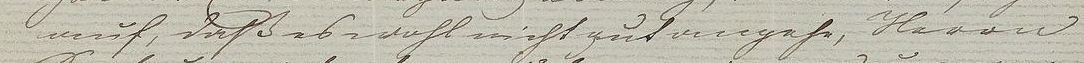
auf, daß es wohl nicht gut angehe, Herrn
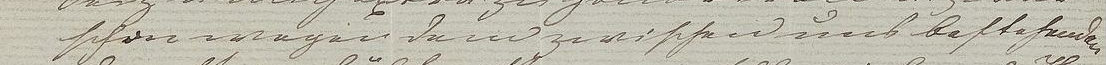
schon wegen dem zwischen uns bestehenden
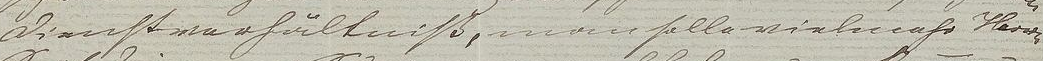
Dienstverhältniß, man solle vielmehr Herrn
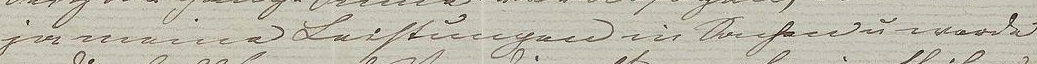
ja meine Leistungen in Sachen u werde
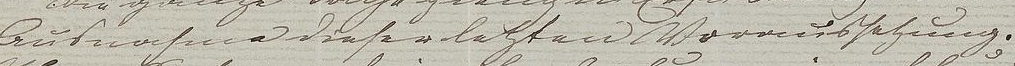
Ausnahme dieser letzten Voraussetzung.
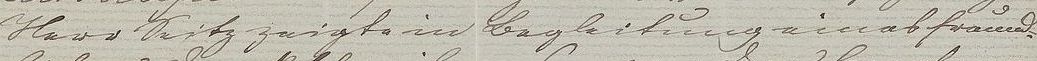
Herr Seitz zeigte in Begleitung eines freund-
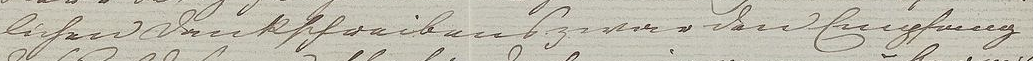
lichen Dankschreibens zwar den Empfang
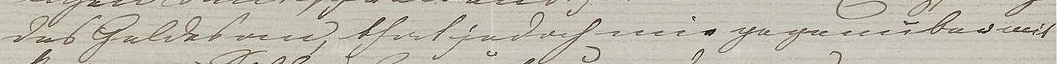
des Geldes an, that jedoch mir gegenüber mit
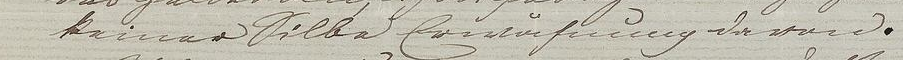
keiner Silbe Erwähnung daran.
